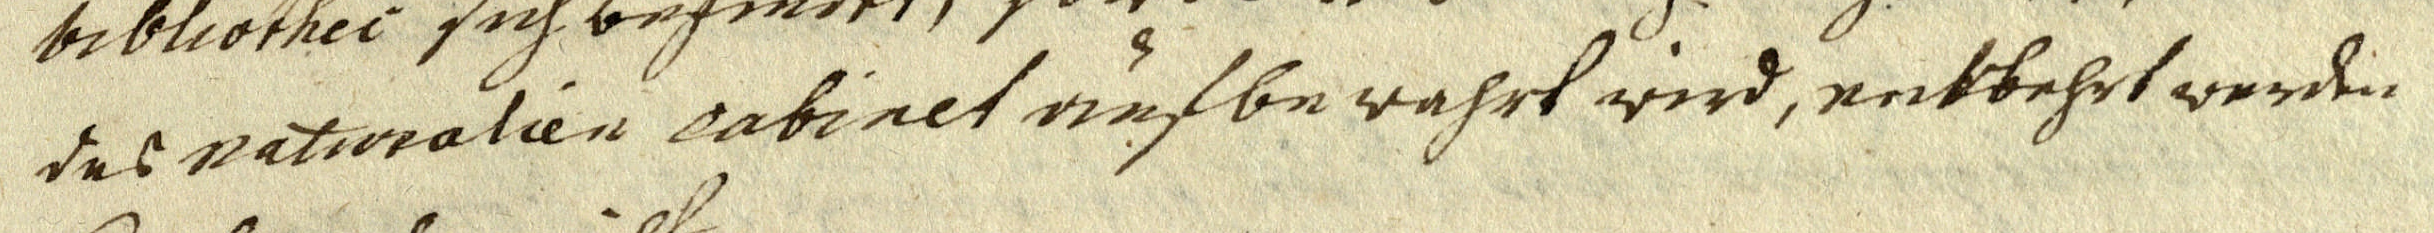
das naturalien cabinet aufbewahrt wird, entbehrt werden
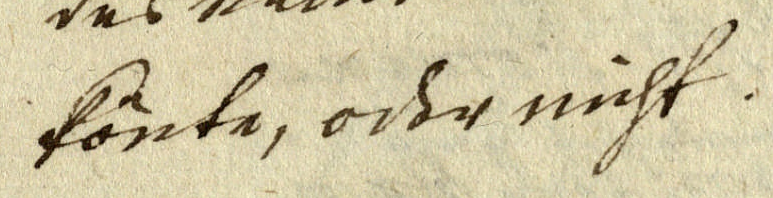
könte, oder nicht.
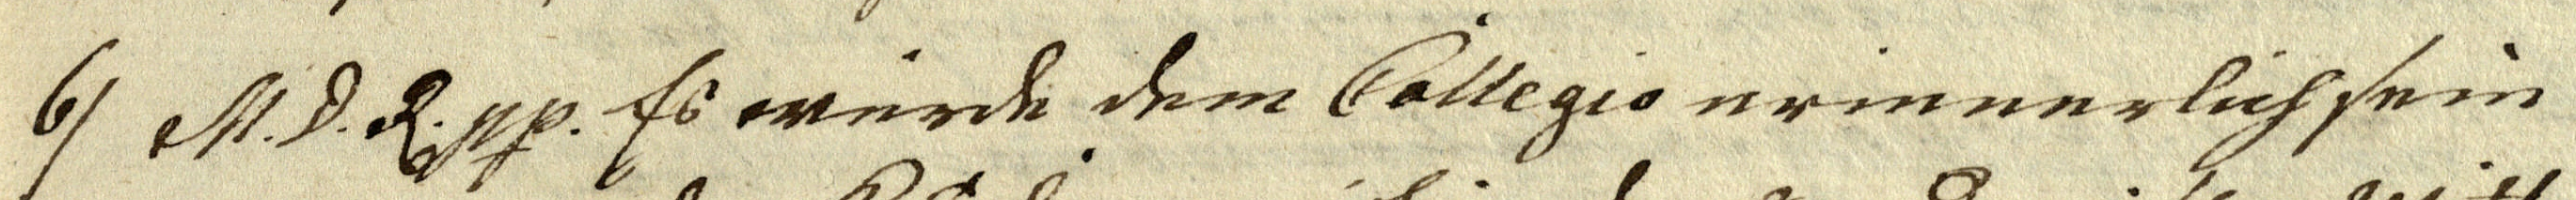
6/ M. D. R. pp.Es würde dem Collegio erinnerlich sein,
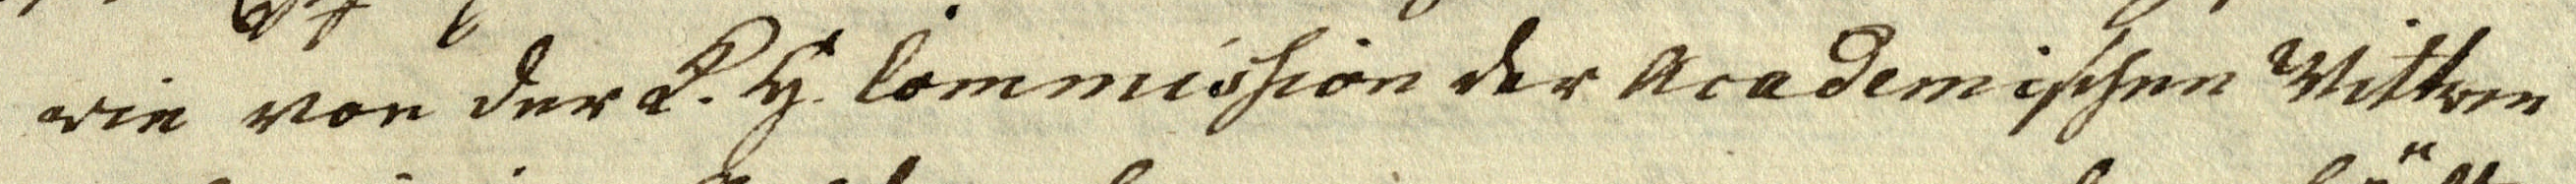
wie von der K. H. Commission der Academischen Wittwen
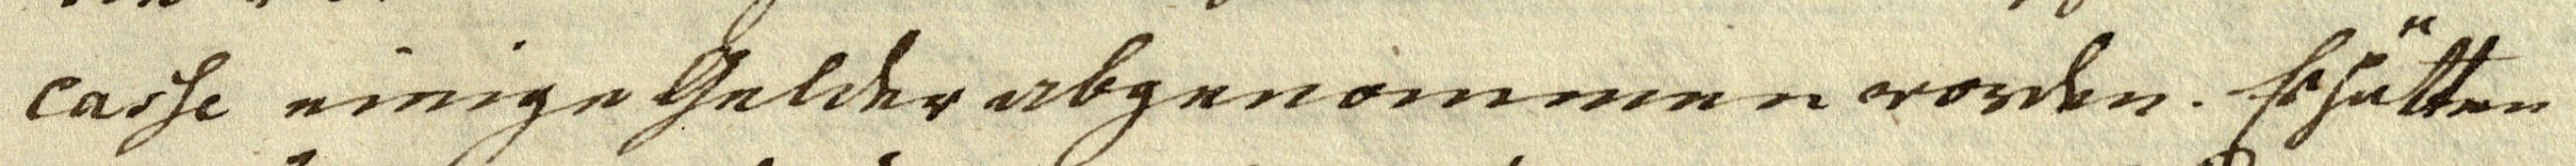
casse einige Gelder abgenommen worden. Es hätten
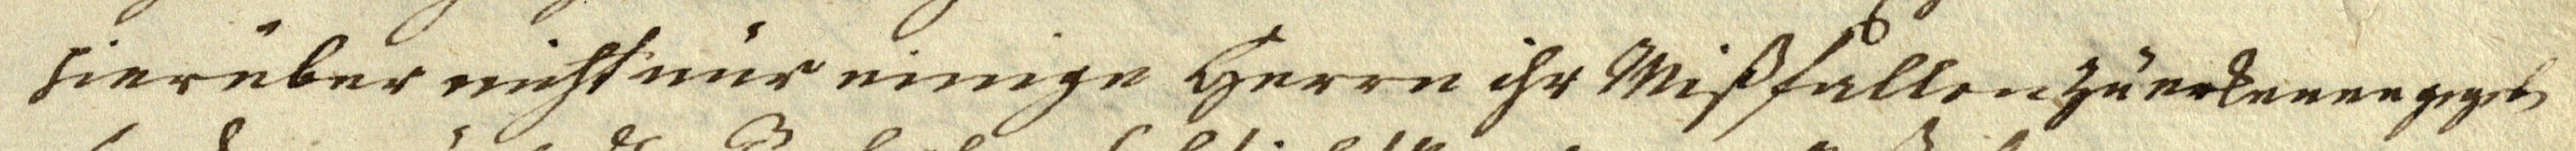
hierüber nicht nur einige Herren ihr Mißfallen zu erkennen gegeb,
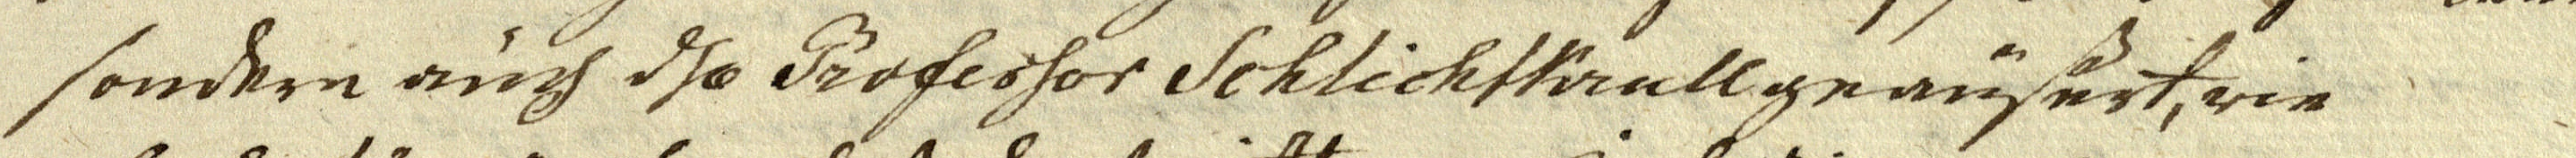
sondern auch dh. Professor Schlichtkrull geäußert, wie
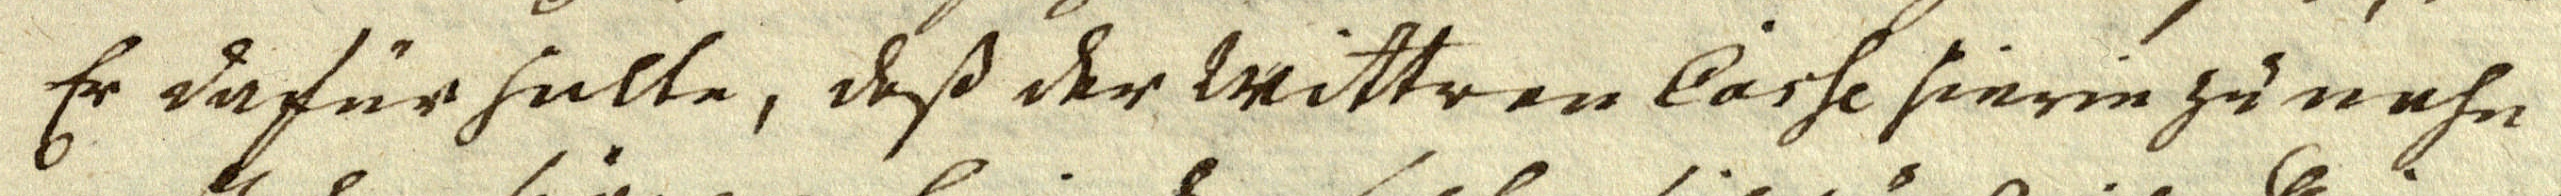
Er dafür halte, daß der Wittwen Casse hierin zu nahe
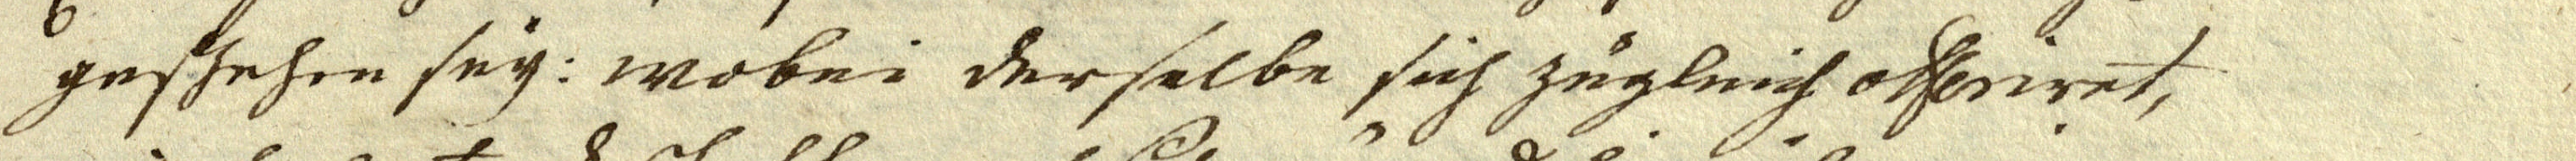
geschehen seÿ: wobei derselbe sich zugleich offeriret,
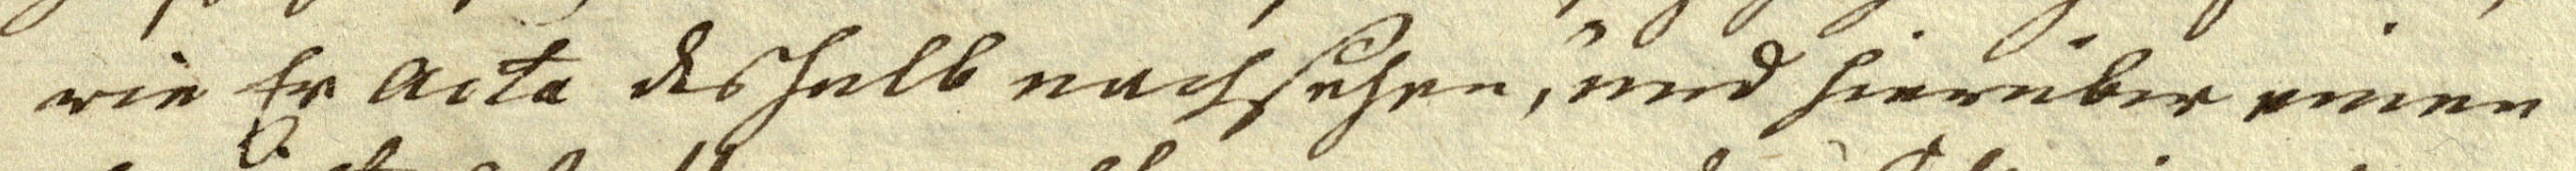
wie Er Acta deshalb nachsehen, und hierüber einen
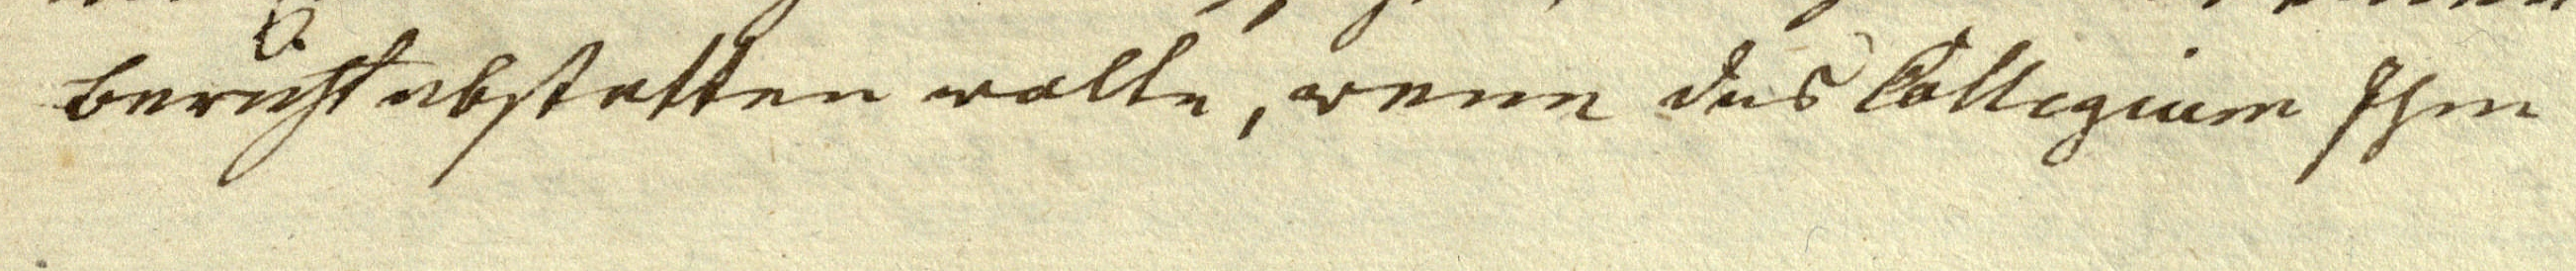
Bericht abstatten wolle, wenn das Collegium Ihm
